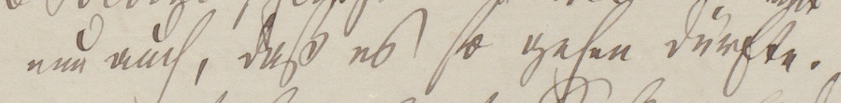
nun auch, daß es so gehen dürfte.
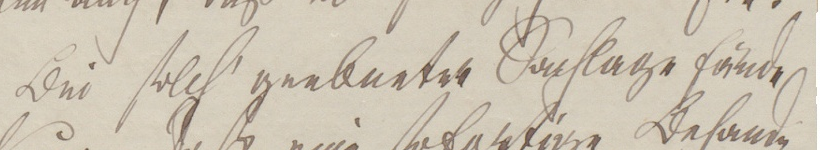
Bei solch' geebneter Sachlage fände
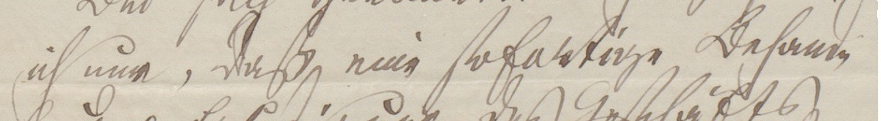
ich nur, daß eine sofortige Behand-
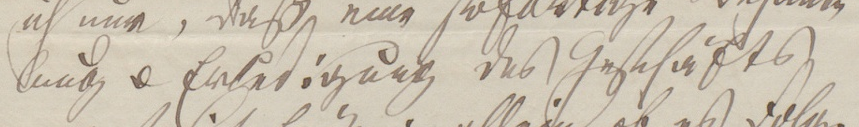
lung & Erledigung des Geschäfts
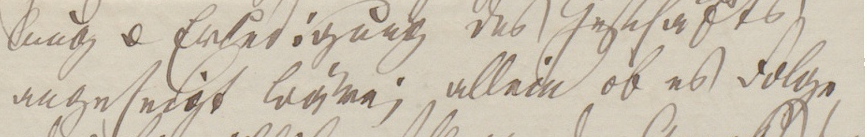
angezeigt wäre; allein ob es Folge
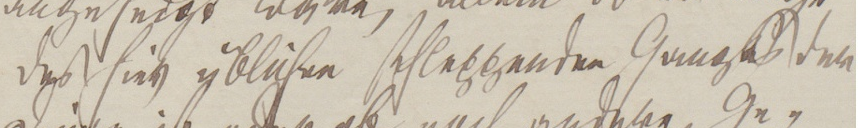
des hier üblichen schleppenden Ganges der
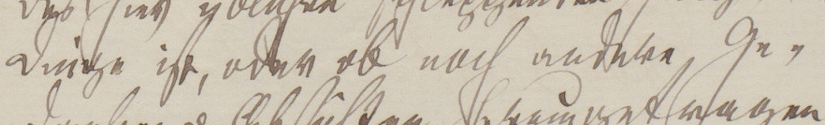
Dinge ist, oder ob noch andere Ge-
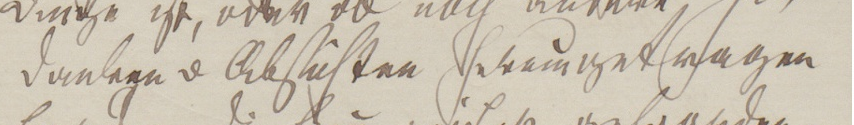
danken & Absichten herumgetragen
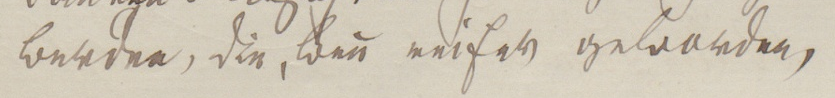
werden, die, wenn reifer geworden,
